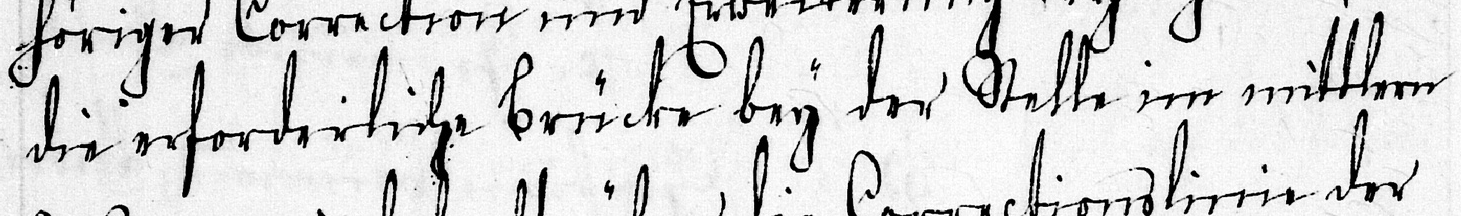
die erforderliche Brücke bey der Stelle im mittlern
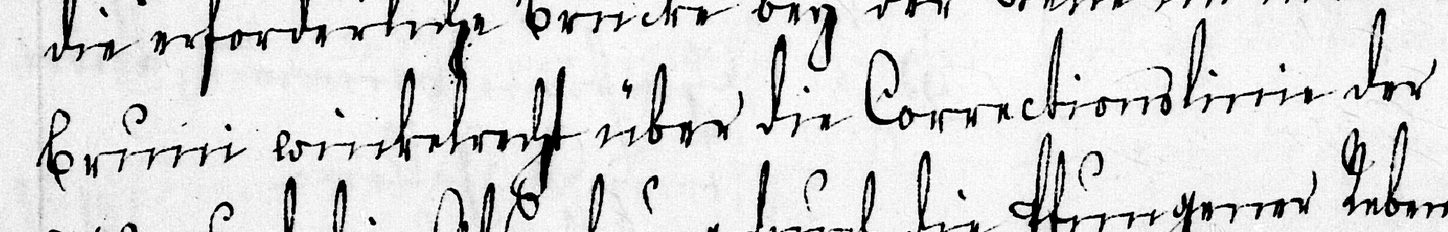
Bruni winkelrecht über die Correctionslinie der
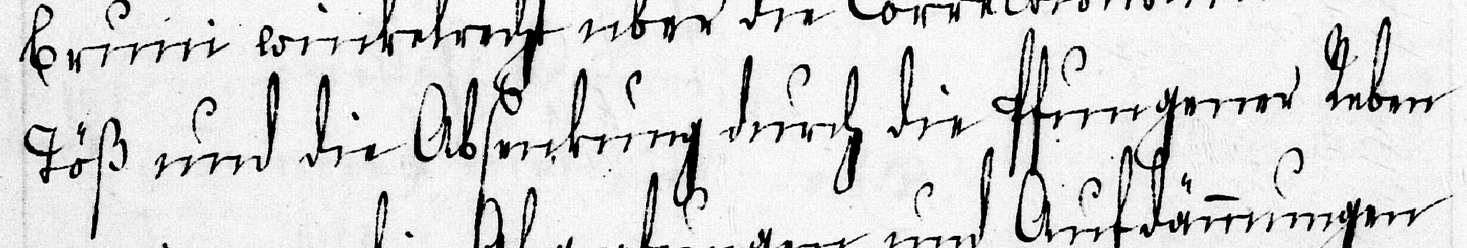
Töß und die Absenkung durch die Pfungener Reben
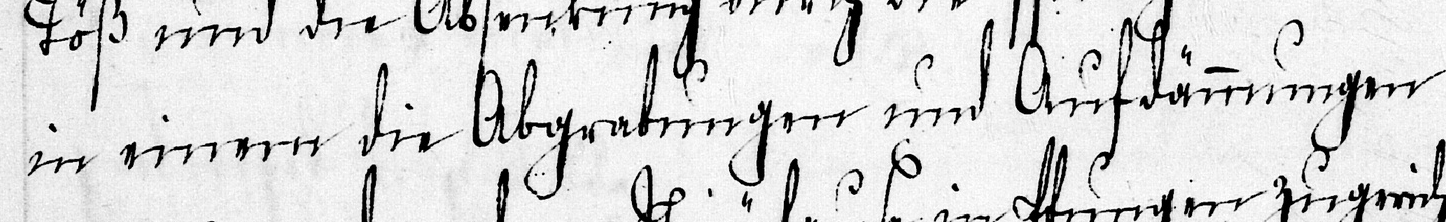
in einem die Abgrabungen und Aufdämmungen
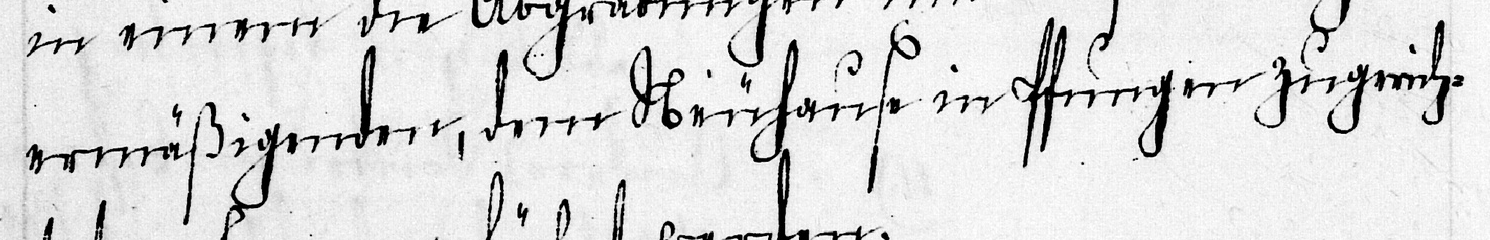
ermäßigenden, dem Neuhause in Pfungen zugerich¬
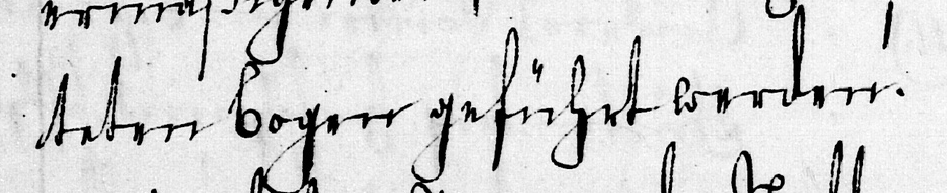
teten Bogen geführt werden.
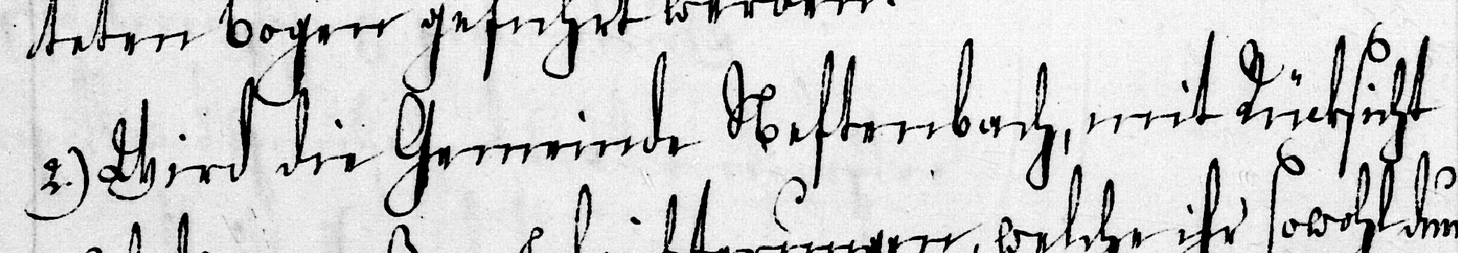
2.) Wird die Gemeinde Neftenbach, mit Rücksicht
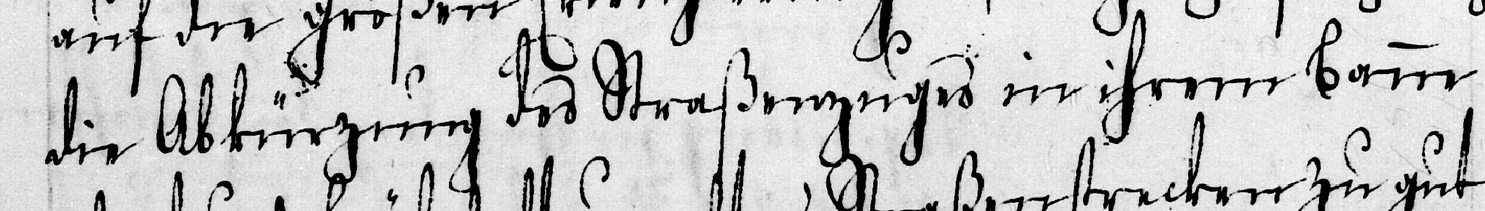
die Abkürzung des Straßenzuges in ihrem Banne
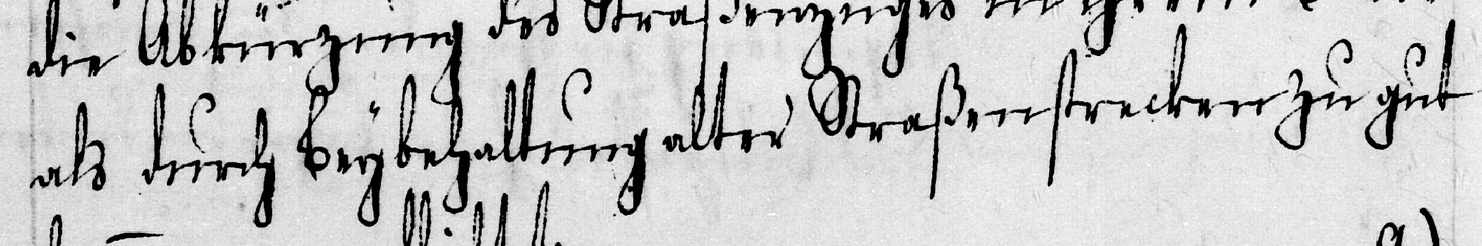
als durch Beybehaltung alter Straßenstrecken zu gut
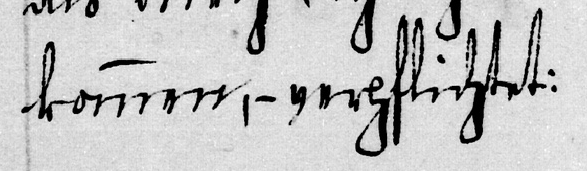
kommen, – verpflichtet:
